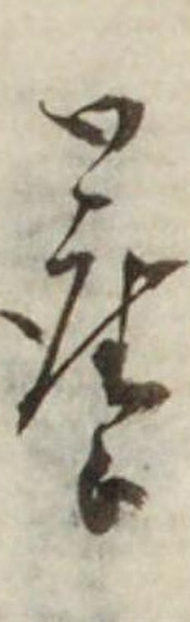御座候
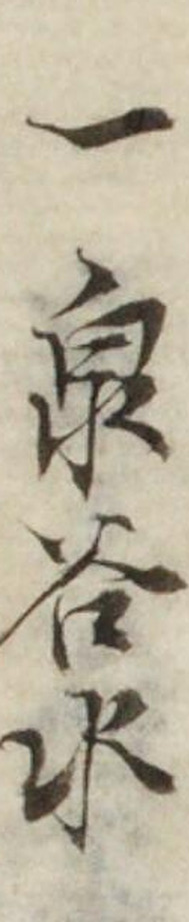一泉谷水
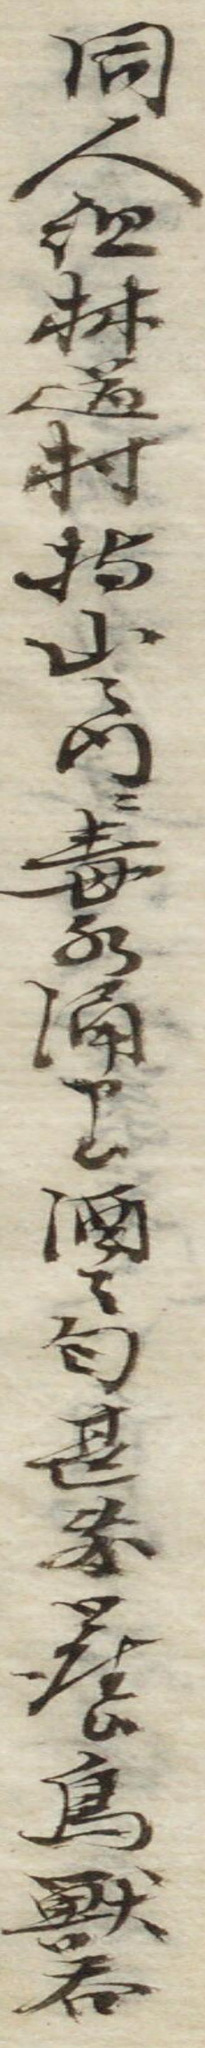同人組林道村持山之内に毒水涌申候酒之匂甚敷御座候鳥獣呑
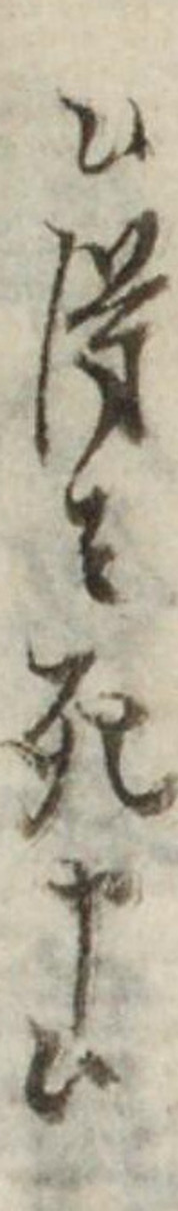候得は死申候
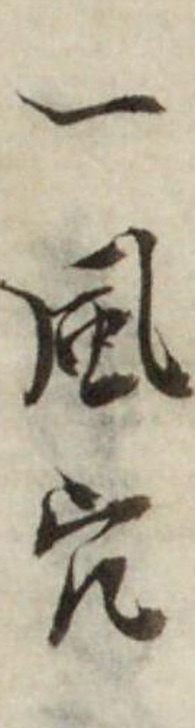一風穴
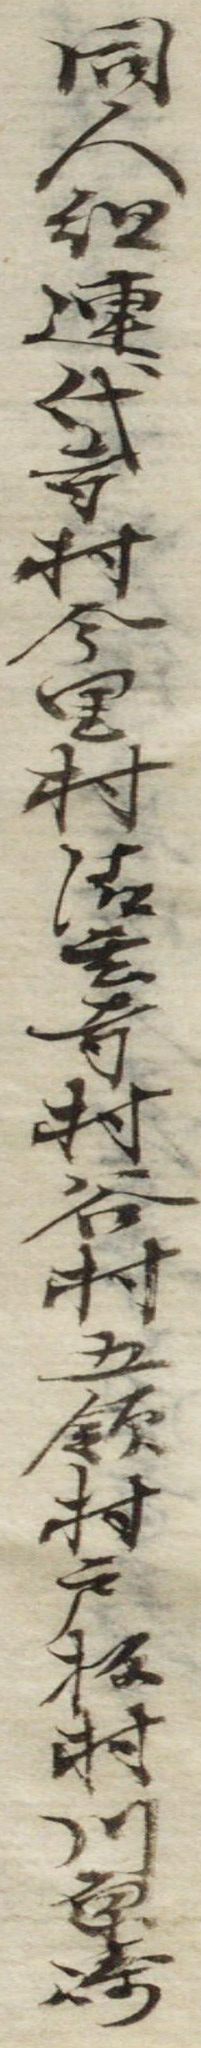同人組連代寺村今里村青雲寺村谷村五領村戸板村河原崎

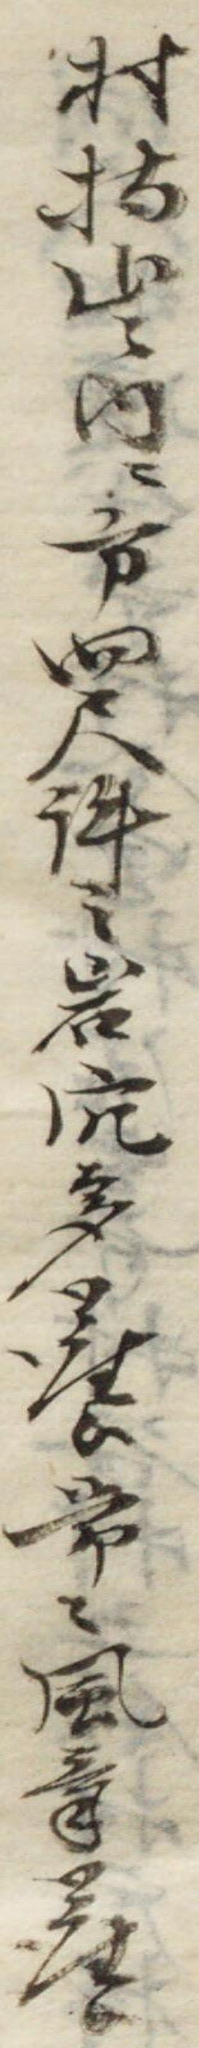村持山之内に方四尺許之岩穴多御座候常に風気御座候
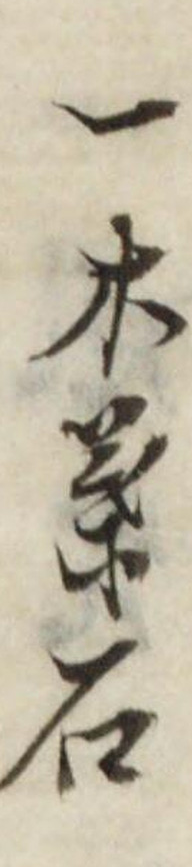一木葉石
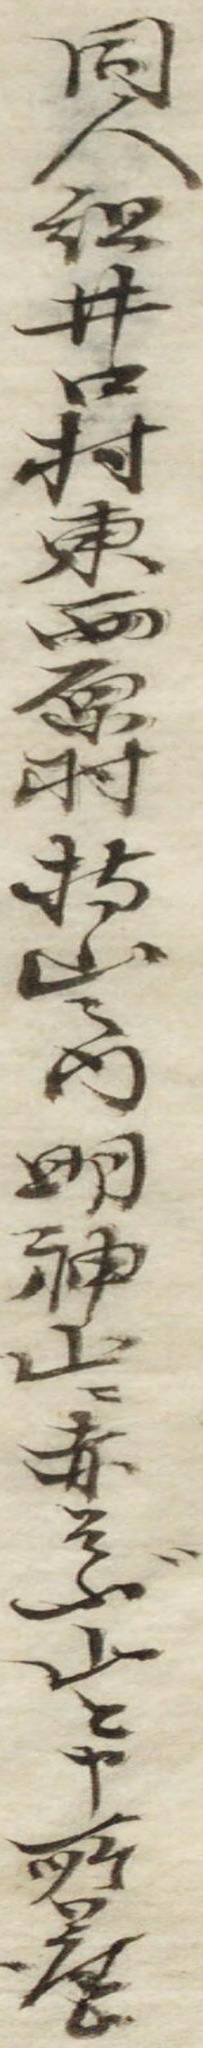同人組井口村東西原村持山之内明神山に赤そぶ山と申所御座候
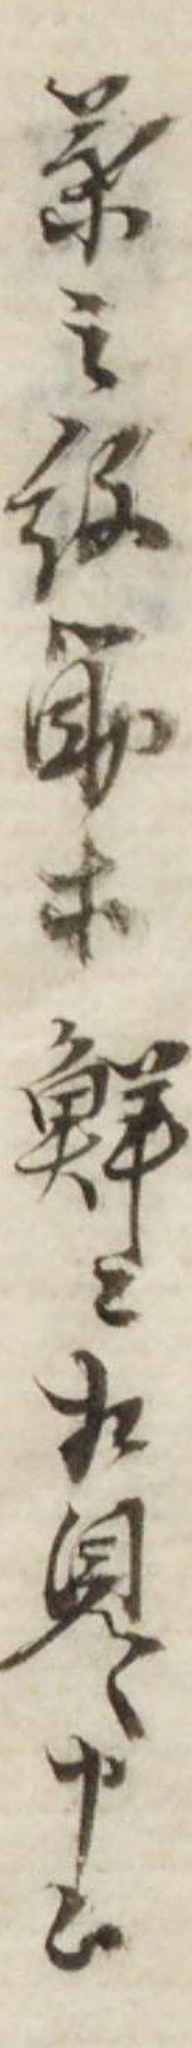葉之紋筋等鮮に相見へ申候
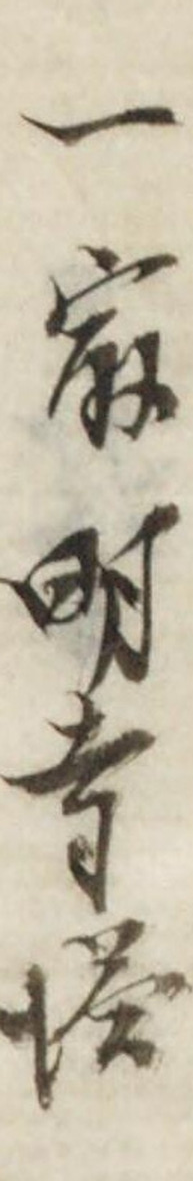一西明寺塔
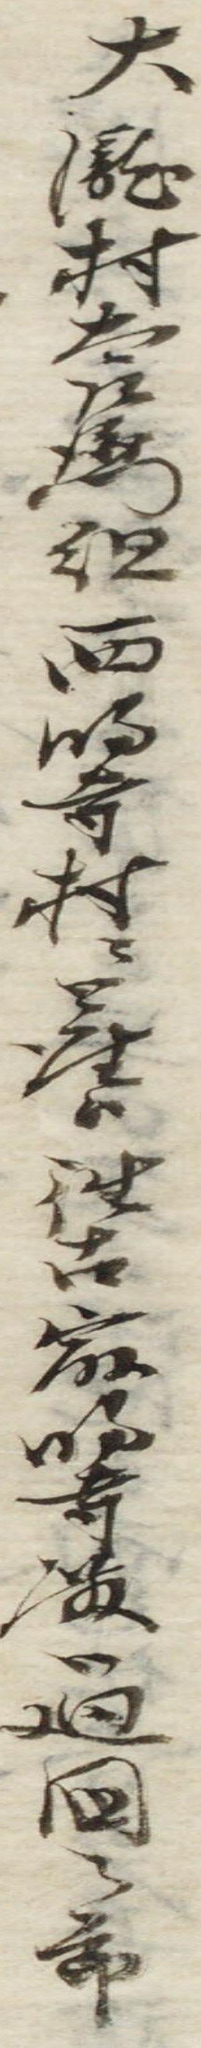大瀧村太左衛門組西明寺村に御座候往古西明寺殿御廻国之節
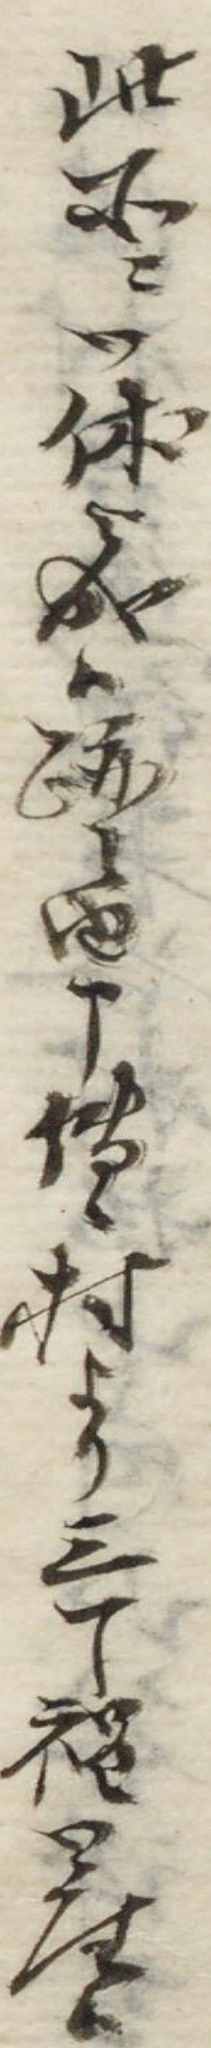此所に御休被成候跡之由申伝候村より三丁程御座候
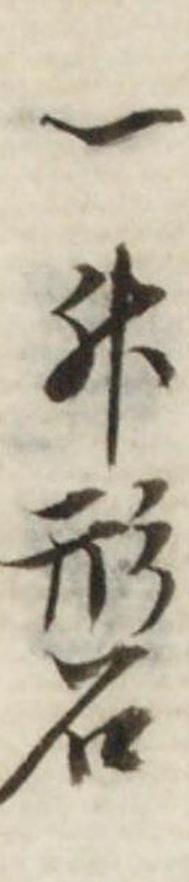一升形石
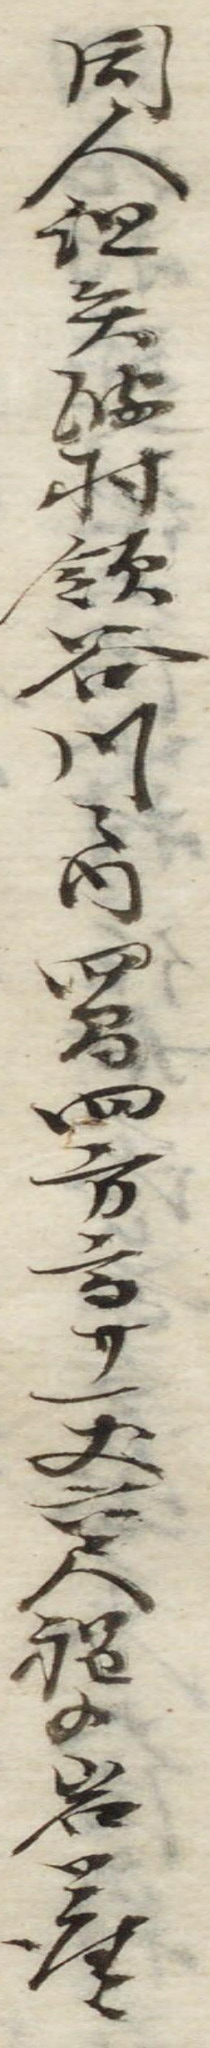同人組矢波村領谷川之内四間四方高さ一丈六尺程の岩御座候
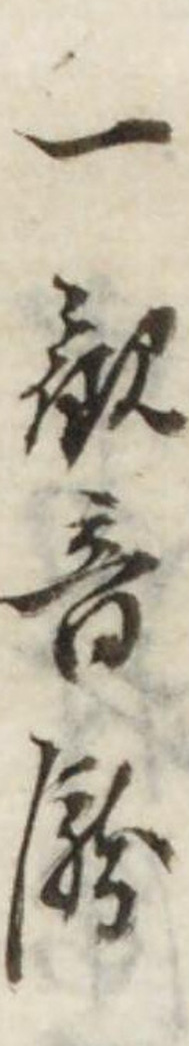一観音瀧
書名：加越能旧聞録
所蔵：Ishikawa Prefectural Library
